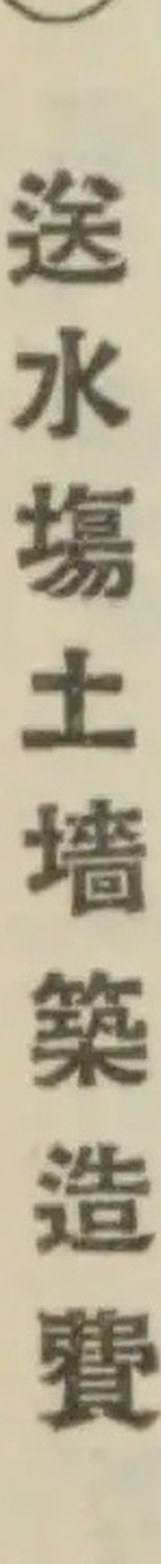(四)送水場土墻築造費
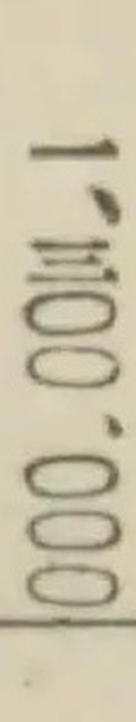試験費三〇〇、〇〇〇
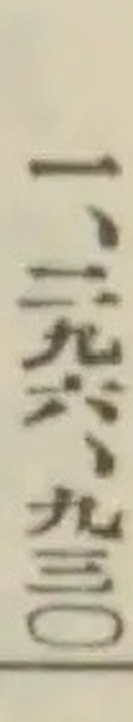雑工一二九六、九三〇
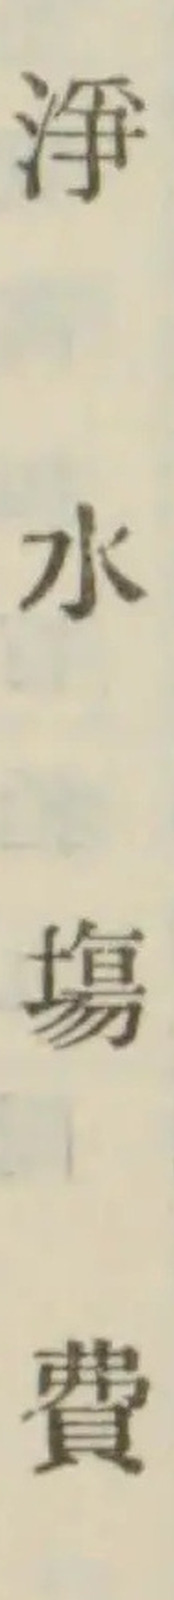浄水場費
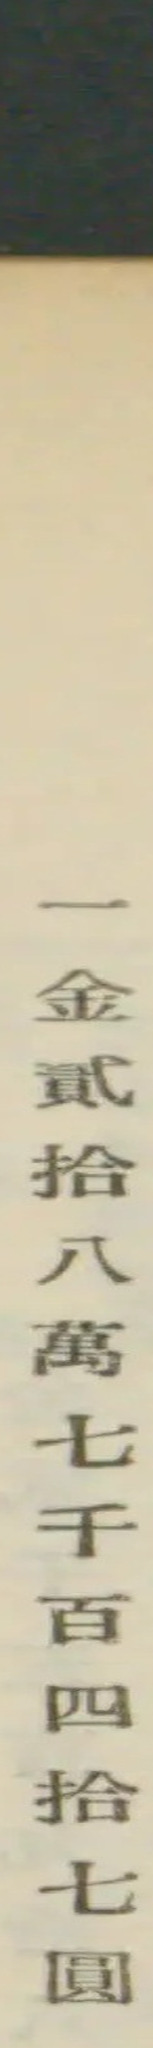一金貳拾八萬七千百四拾七圓
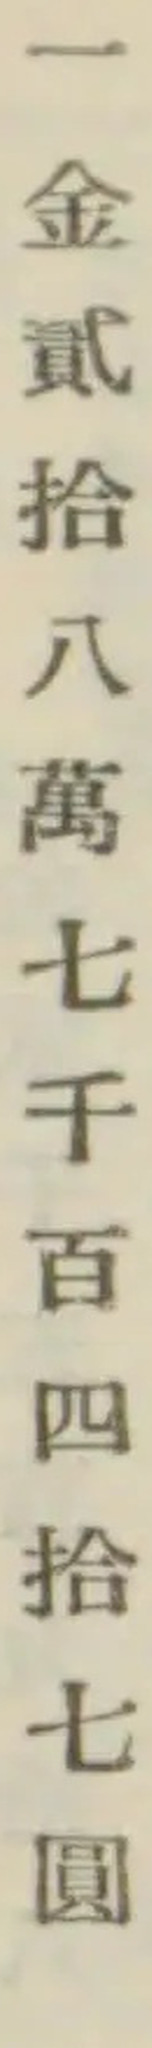一金貳拾八萬七千百四拾七圓
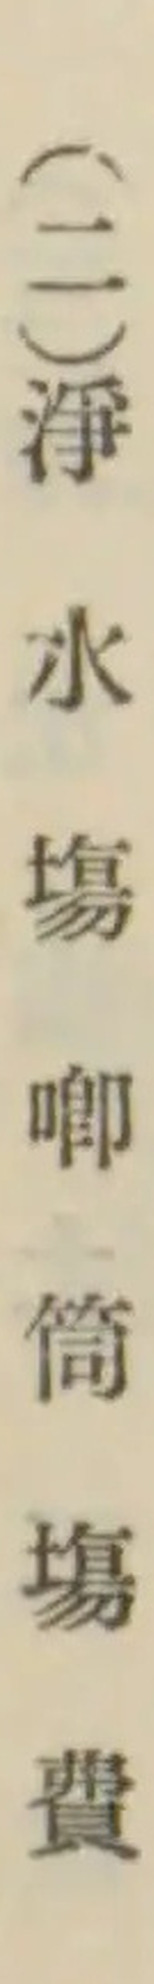(三)送水場喞筒場費

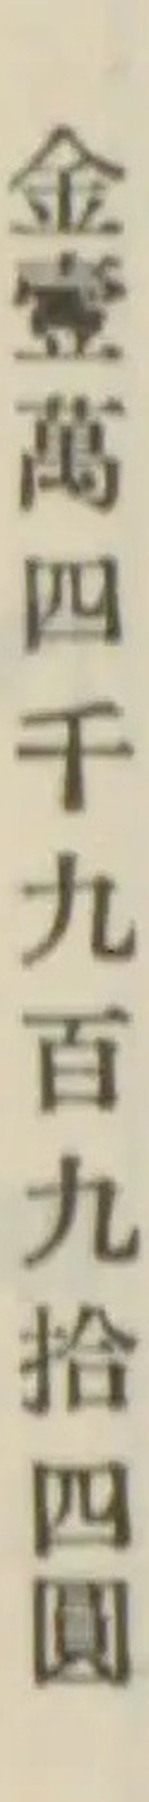一金貳萬千六百九拾四圓
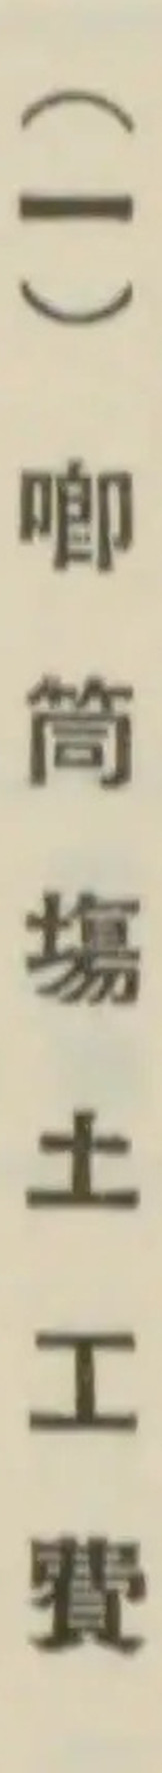(一)喞筒場土工費
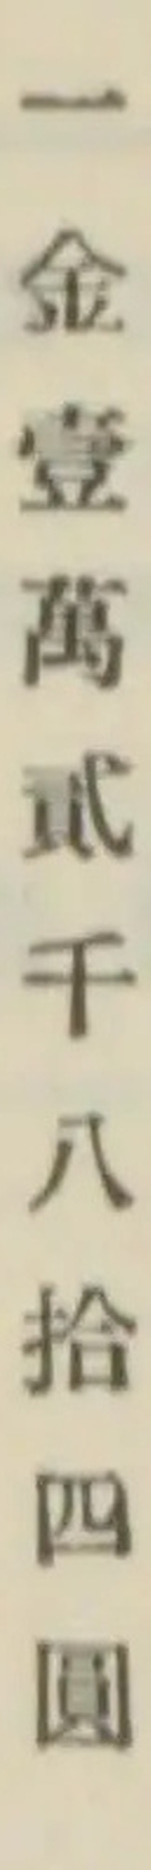一金壹萬貳千八拾四圓
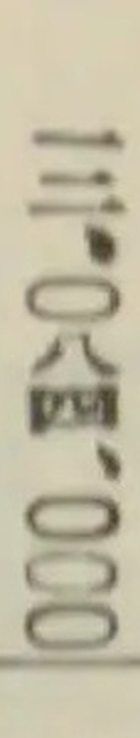計一二、〇八四、〇〇〇
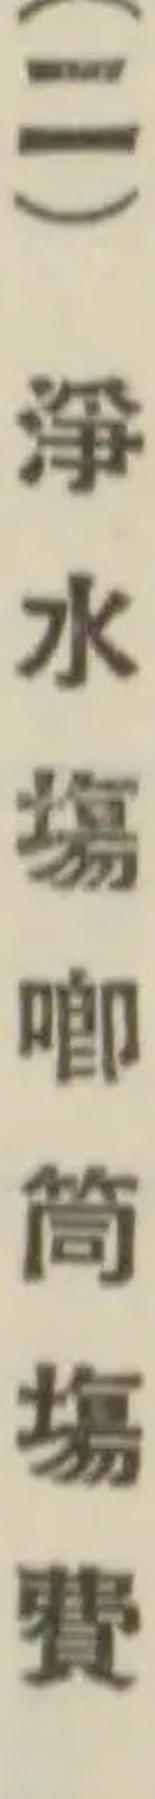(二)浄水場喞筒場費
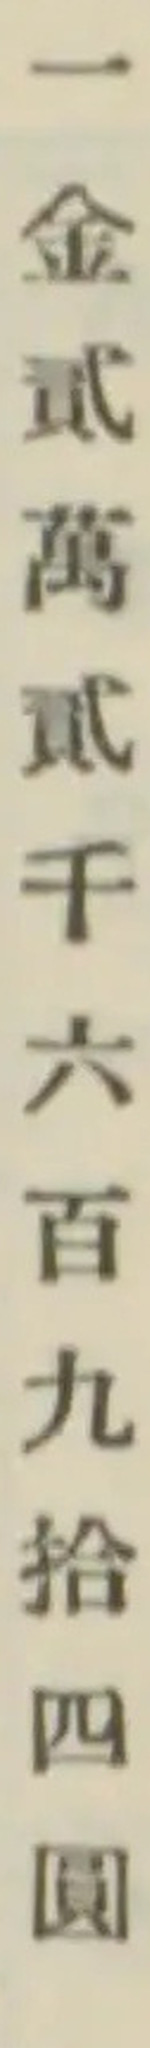一金貳萬千六百九拾四圓
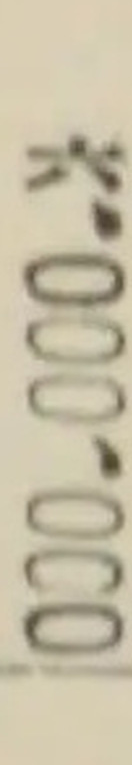木型費四〇〇、〇〇〇
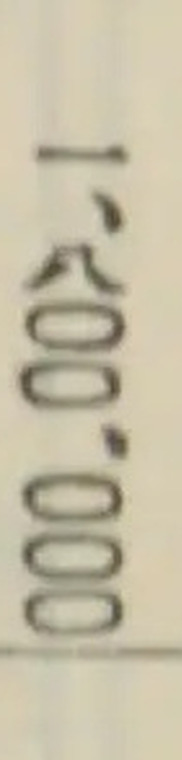變壓機八〇〇、〇〇〇
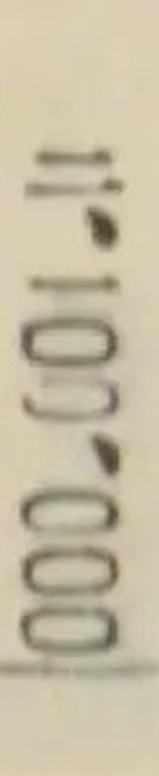木型費四〇〇、〇〇〇
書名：豊橋市水道誌
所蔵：国立国会図書館 National Diet Library, JAPAN
